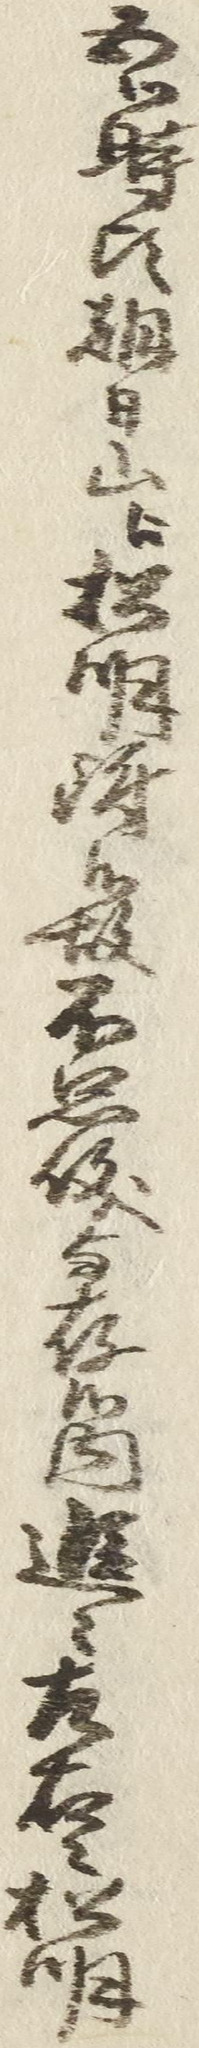五ツ時頃朝日山江松明附候故不思儀与存候内追々左右ニ松明
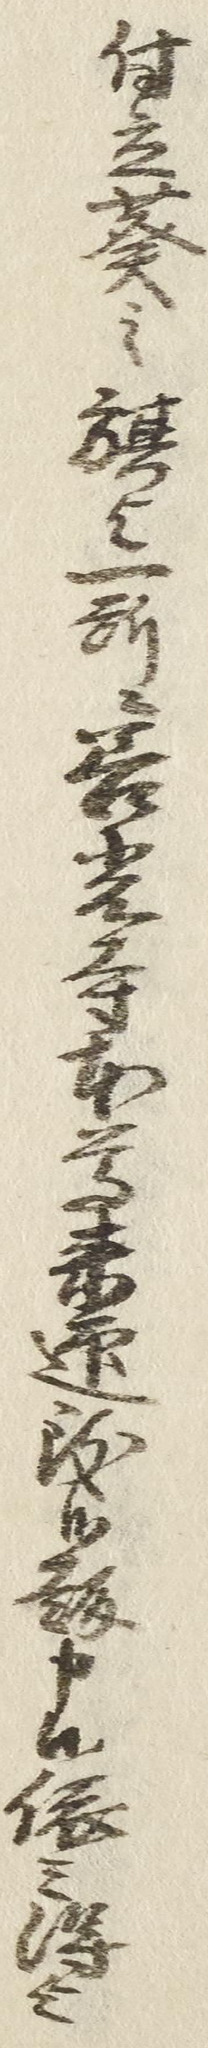付立葵之旗与一所ニ善光寺本尊来迎致候趣申候依之得与
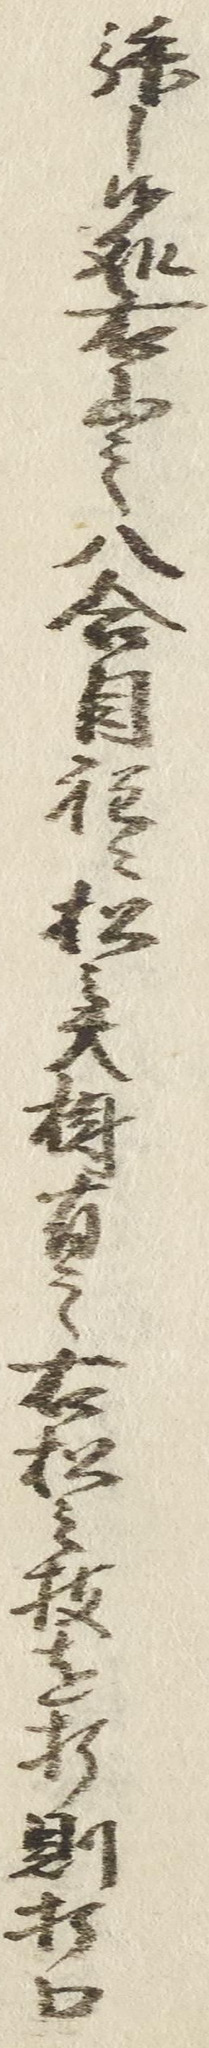拝し候処右山之八合目程ニ松之大樹有之右松之枝を折則折口
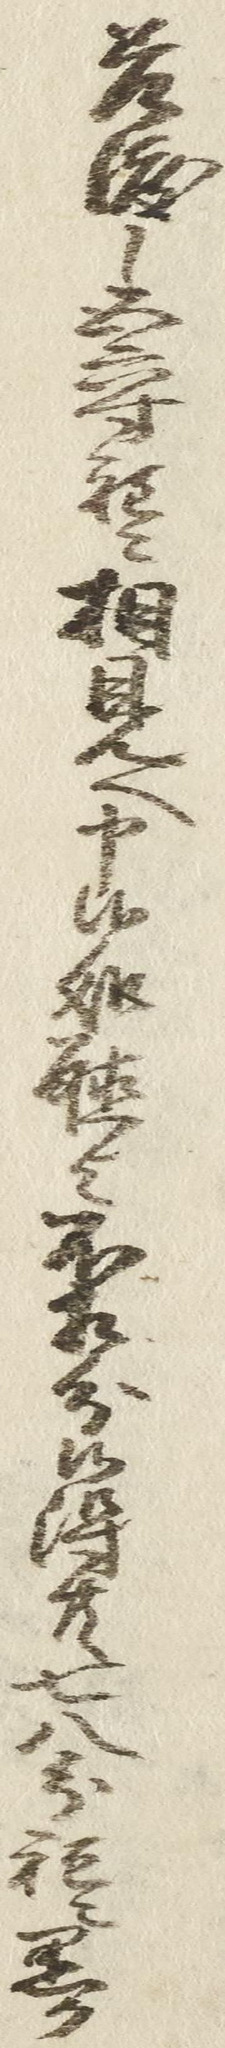差渡し五六寸程ニ相見へ申候処聴与不相分候得共七八分程ニ黒ク
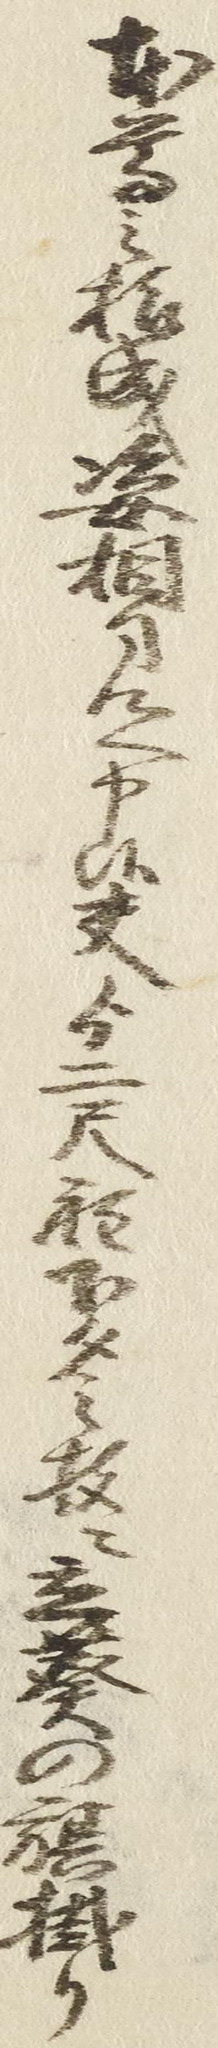本尊之様成姿相見へ申候夫ゟ二尺程下タ之枝ニ立葵の旗掛り
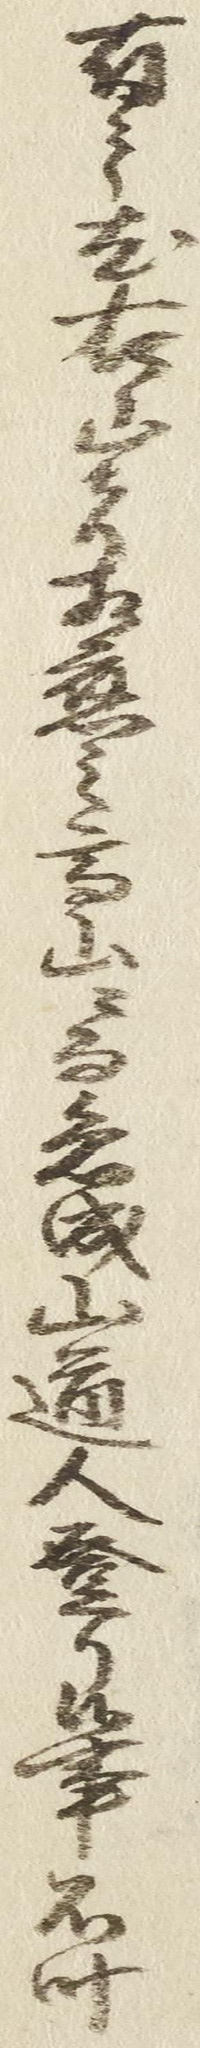有之尤右山は相応之高山ニ而急成山道人登り候事不叶
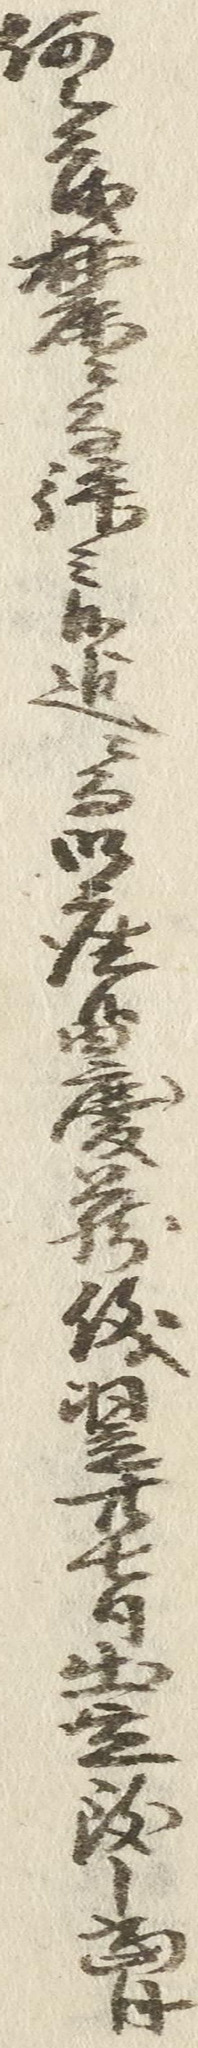何レも麓ニ而拝み候迄ニ而御座候由慶蔵儀翌廿七日出立致し当月
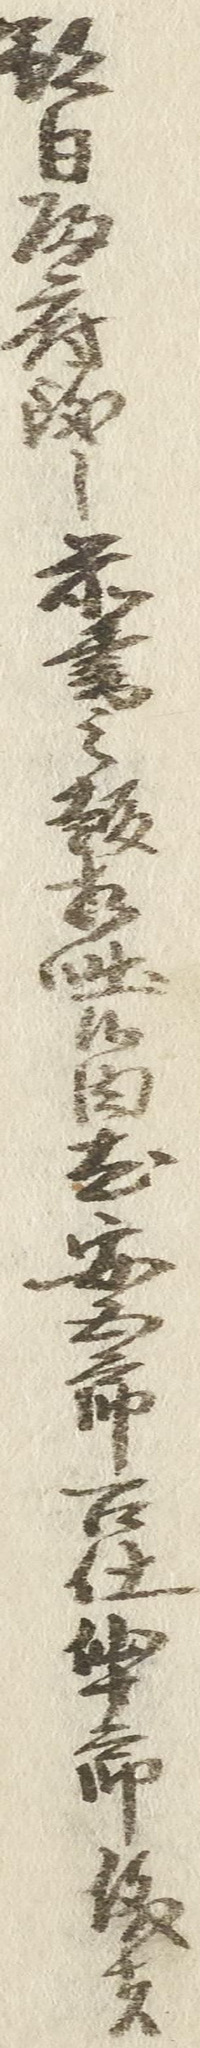朔日帰府致し前害之趣相咄候由尤安五郎召仕仙十郎儀は
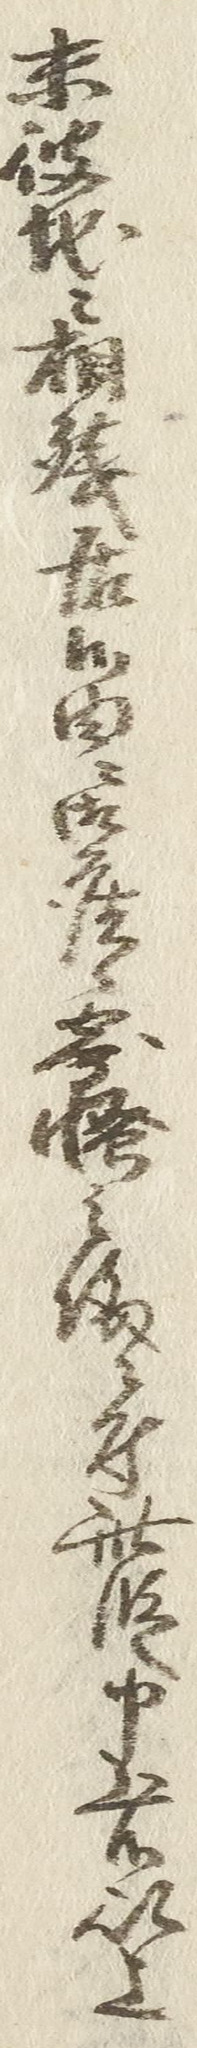未彼地ニ相残居候由ニ御座候奇怪之儀ニ付此段申上候以上
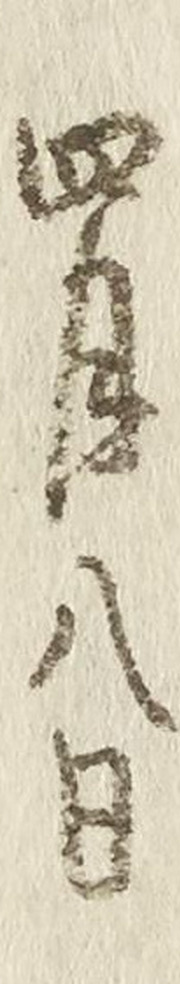四月八日
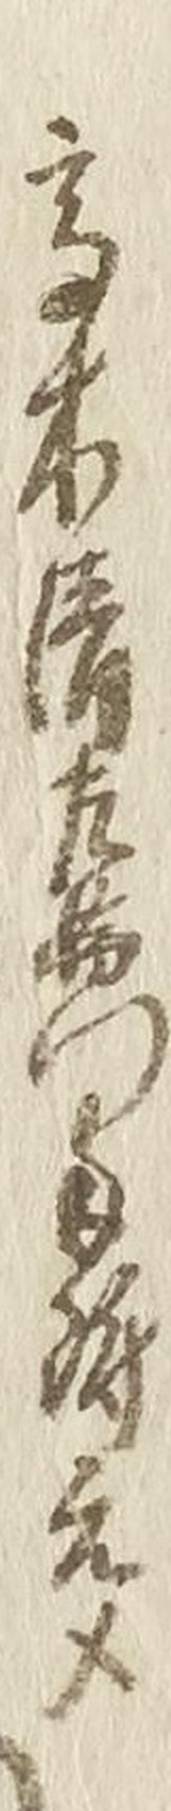髙木清左衛門手附元〆
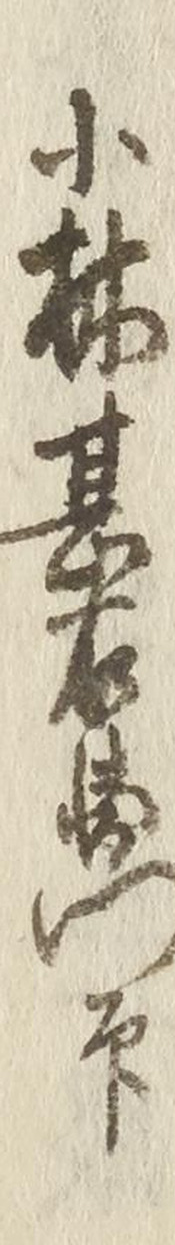小林甚右衛門印
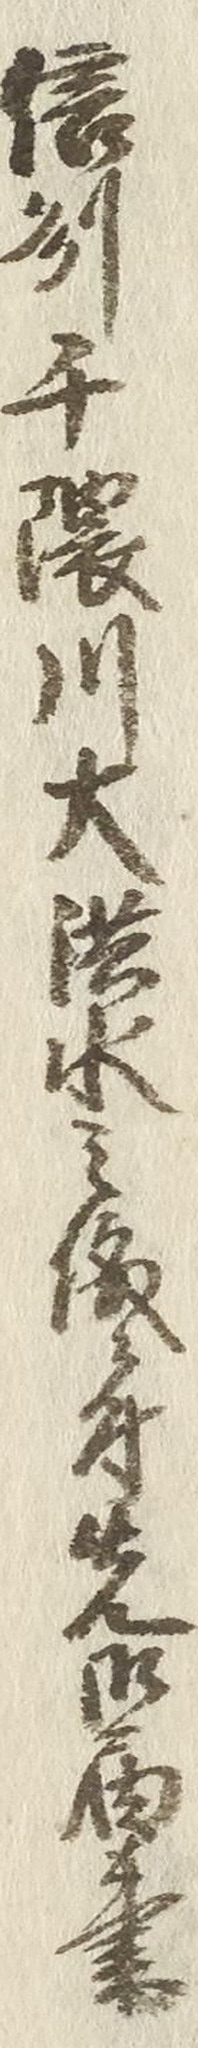信州千隈川大洪水之儀ニ付先御届書
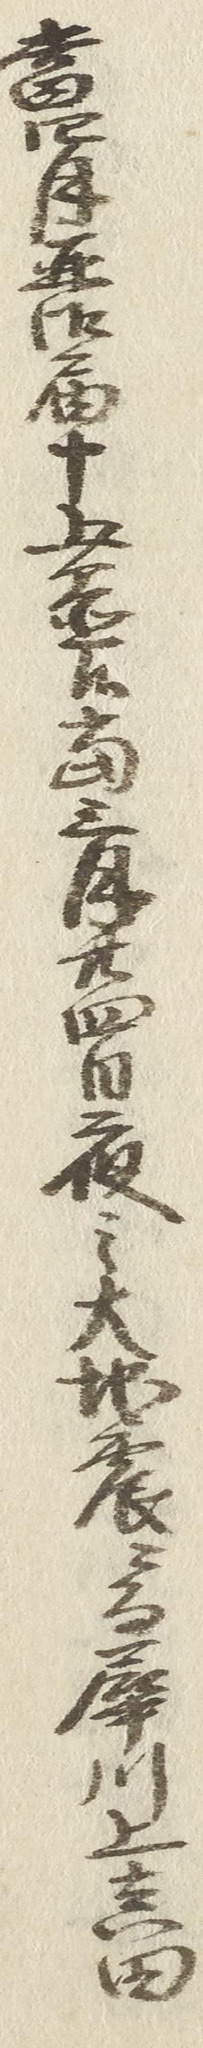当四月再御届申上置候当三月廿四日夜之大地震二而犀川上真田
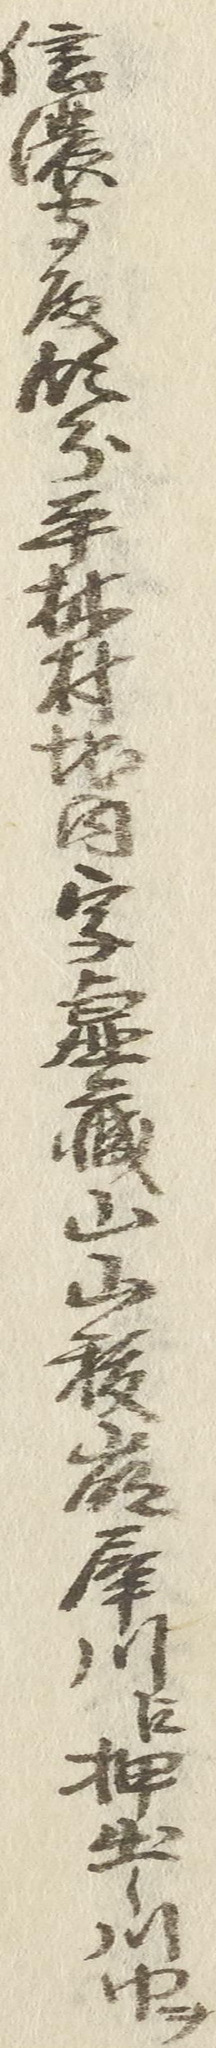信濃守殿領分平林村地内字虚蔵山抜崩犀川江押出し川巾ヲ
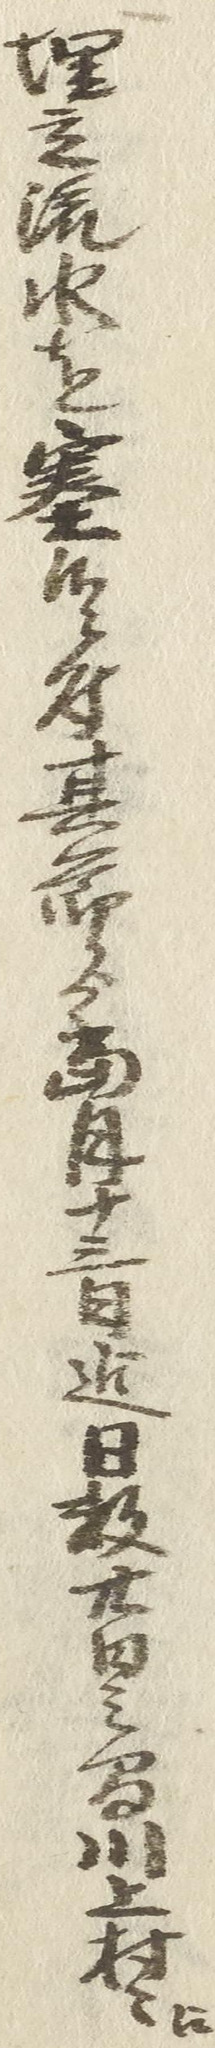埋立流水を塞候ニ付其節ゟ当月十三日迄日数廿日之間川上村々江
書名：従往古地震御届書記誌之一
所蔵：東京大学地震研究所図書室 Earthquake Research Institute Library, The University of Tokyo, JAPAN
